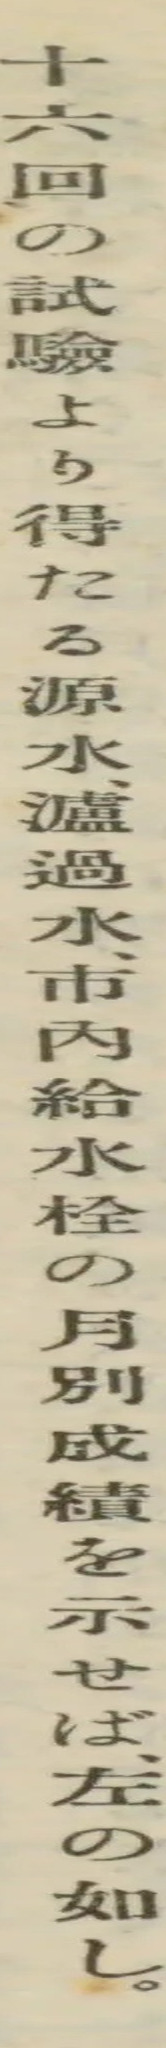十六回の試験より得たる源水、濾過、過水、市内給水栓の月別成績を示せば、左の如し。
